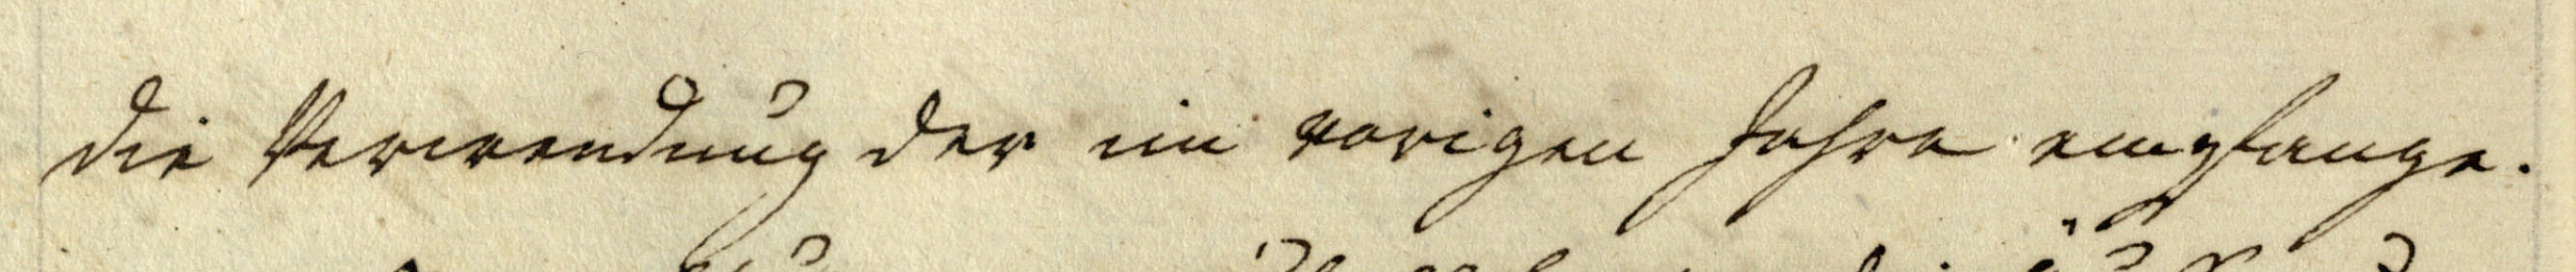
die Verwendung der im vorigen Jahre empfange¬
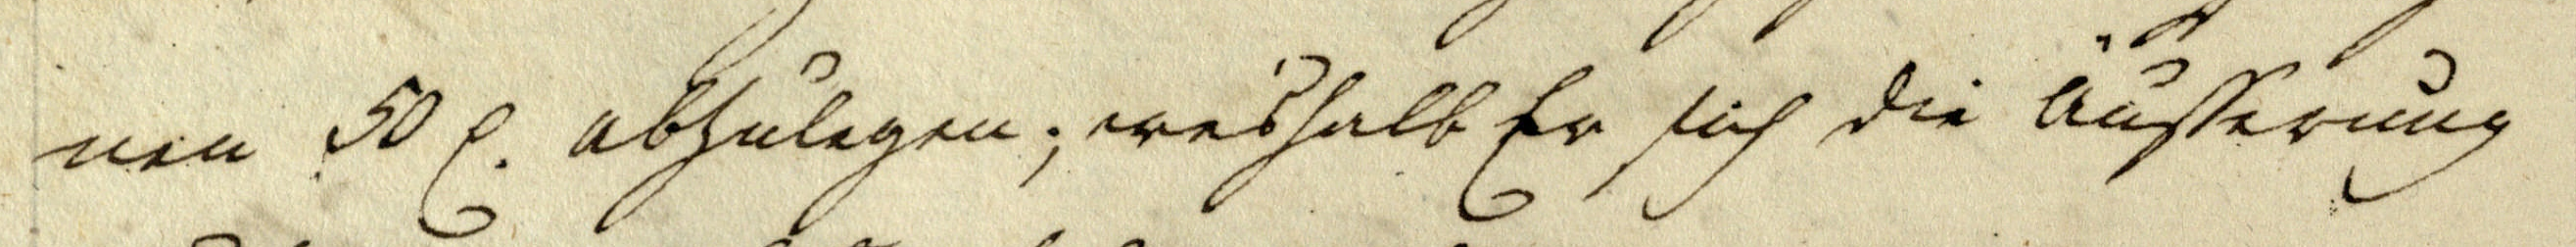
nen 50 l. abzulegen; weshalb Er sich die Äusserung
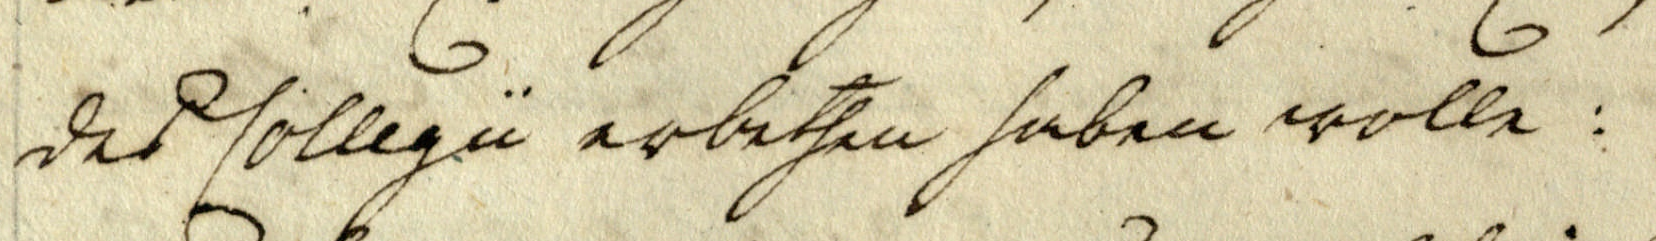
des Collegii erbethen haben wolle:
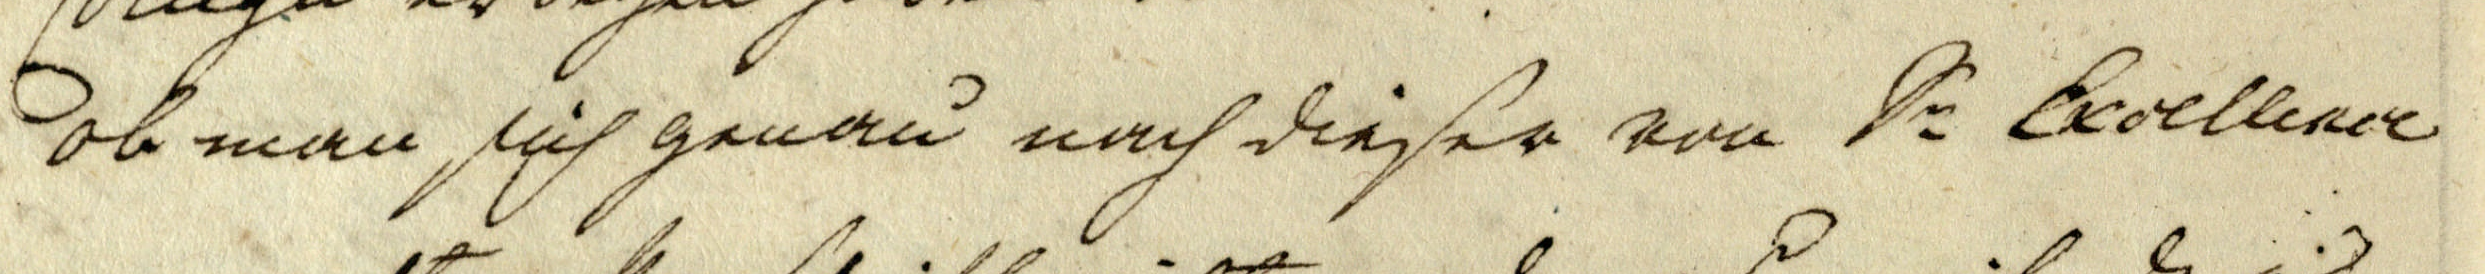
ob man sich genau nach dieser von Sr Excellence
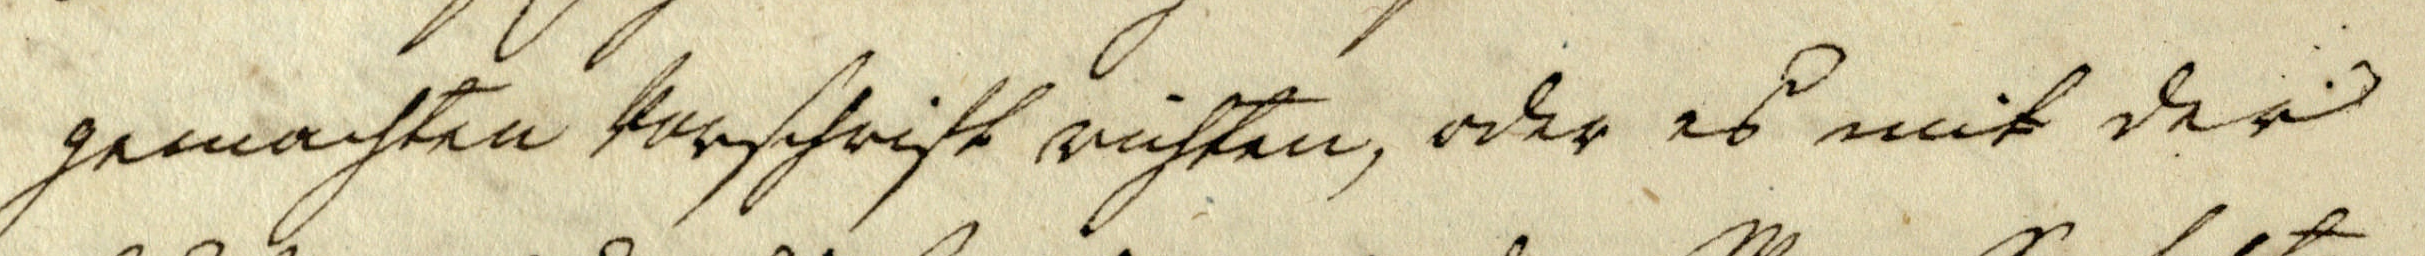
gemachten Vorschrift richten, oder es mit der
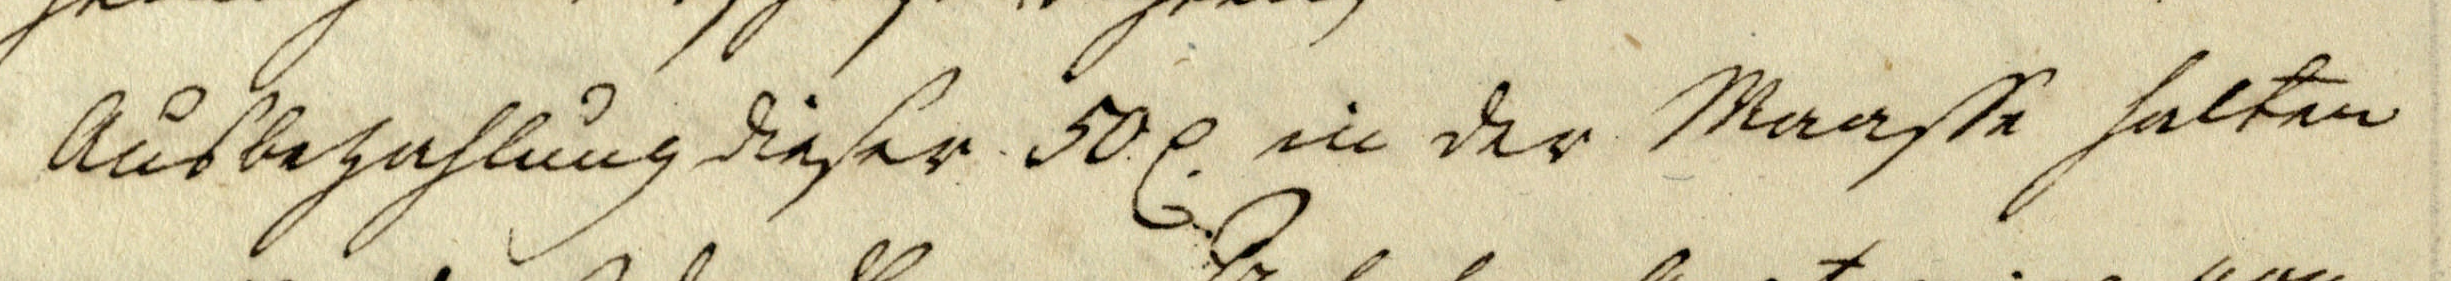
Ausbezahlung dieser 50 l. in der Maasse halten
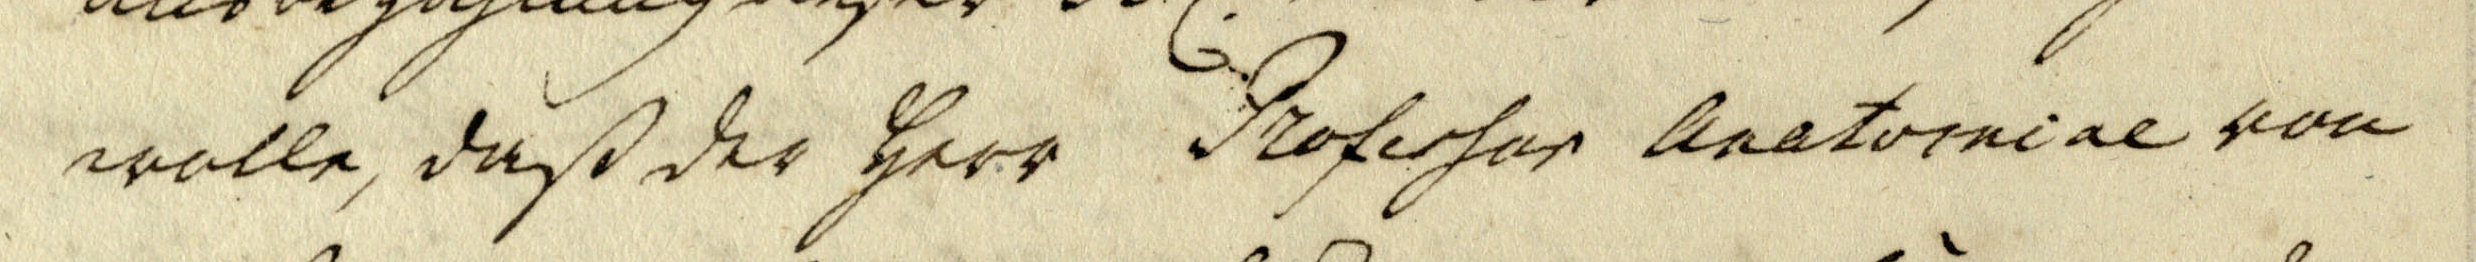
wolle, daß der Herr Professor Anatomiae von
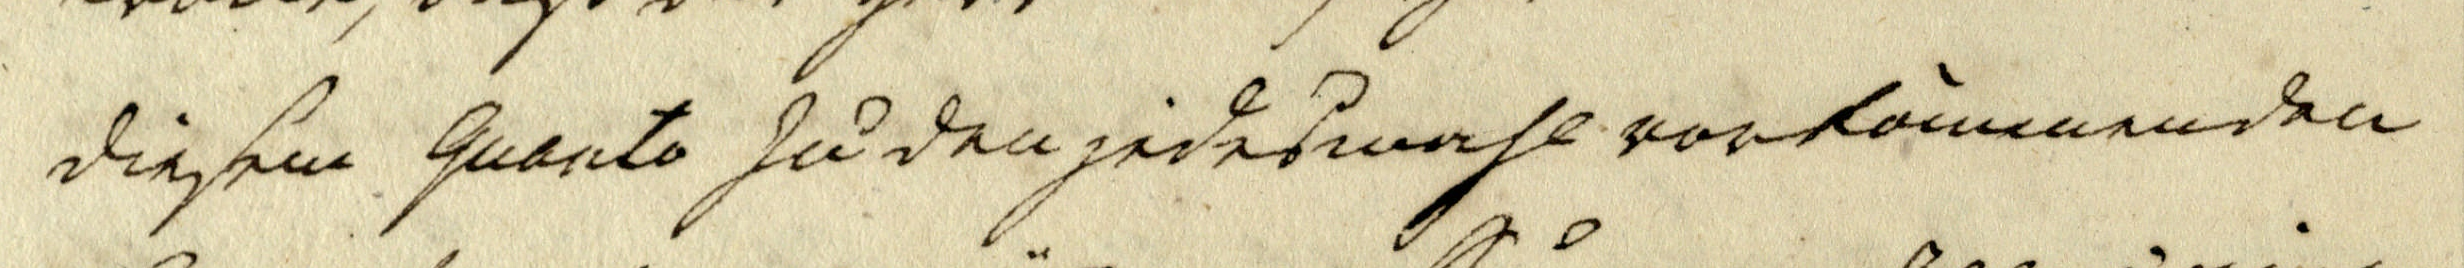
diesem Quanto zu den jedesmahl vorkommenden
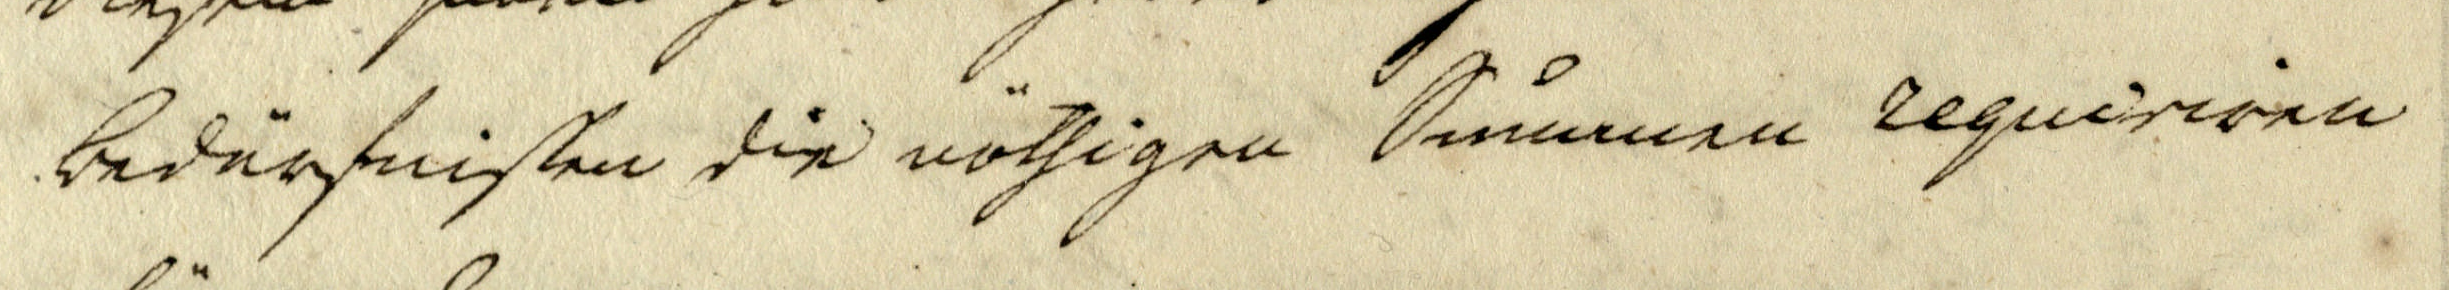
Bedürfnissen die nöthigen Summen requiriren
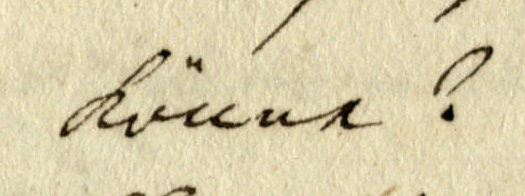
könne?
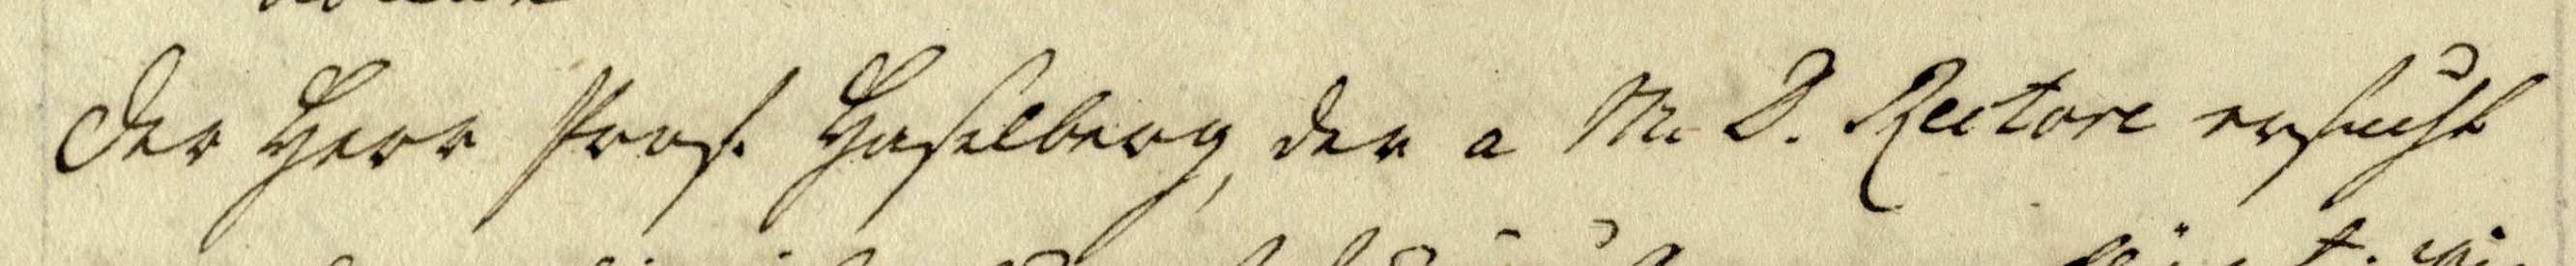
Der Herr Prof. Haselberg, der a M. D. Rectore ersucht
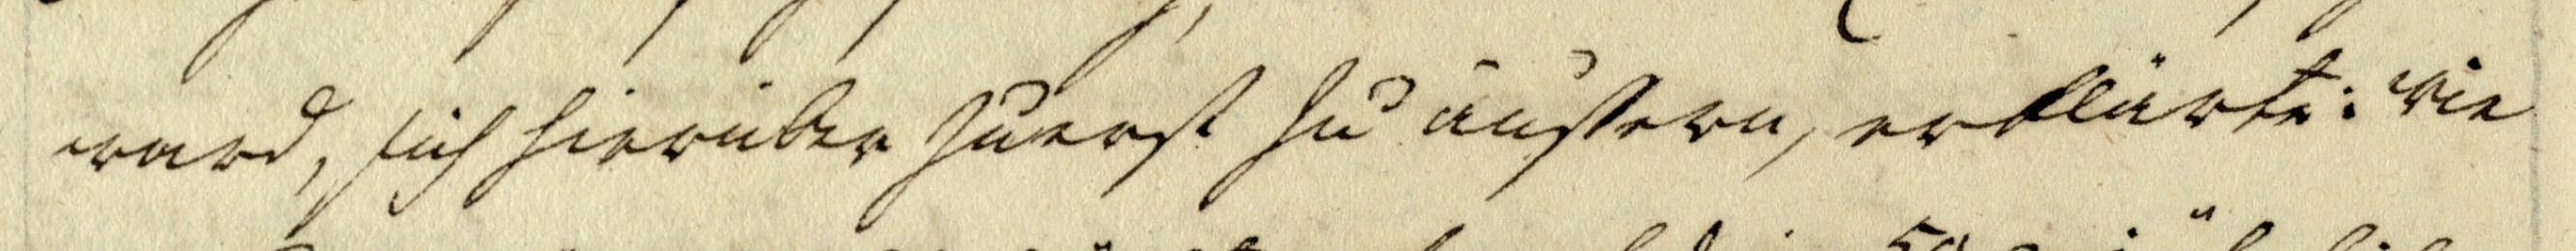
ward, sich hierüber zuerst zu äussern, erklärte: wie
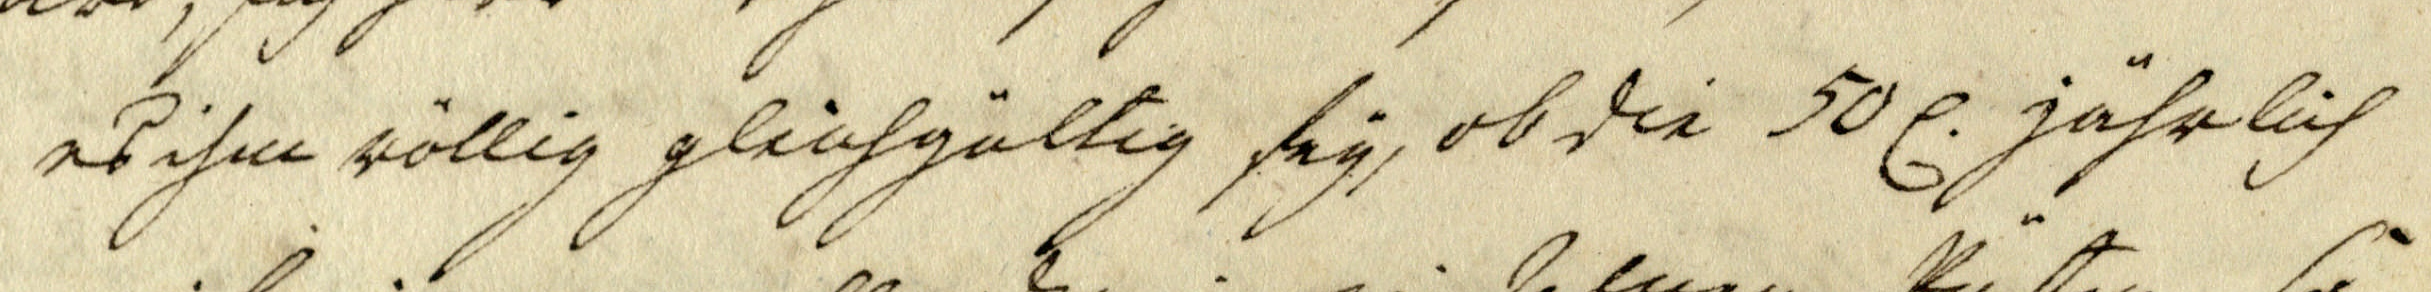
es ihm völlig gleichgültig seÿ, ob die 50 l. jährlich
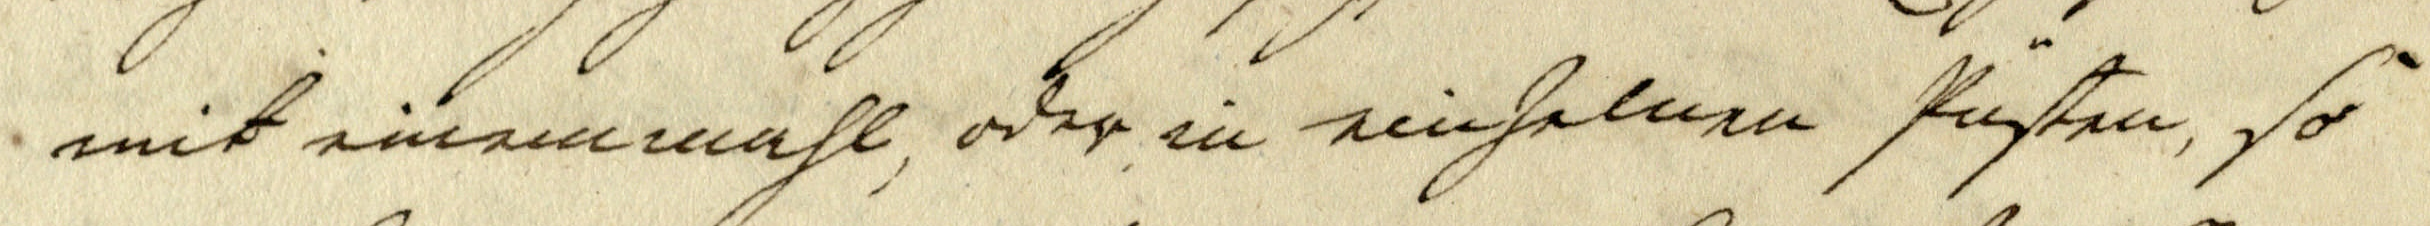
mit einemmahl, oder in einzelnen Pösten, so
